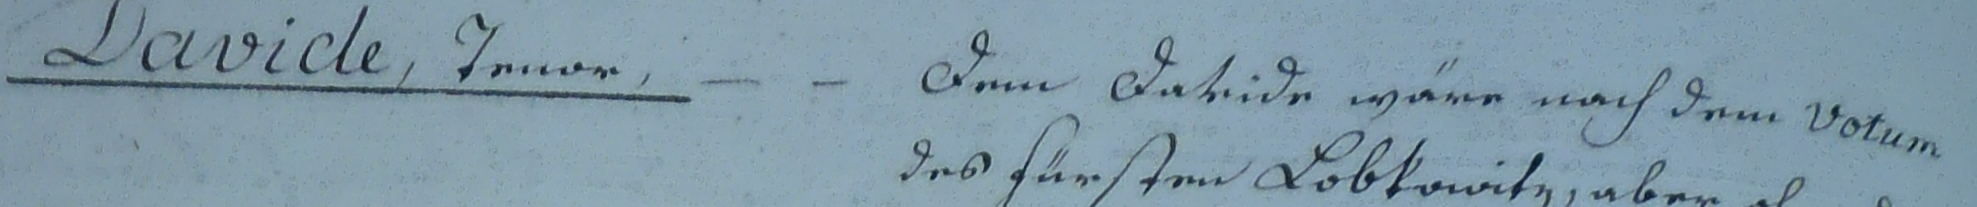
Davide, Tenor, _ _ Dem Davide wäre nach dem votum
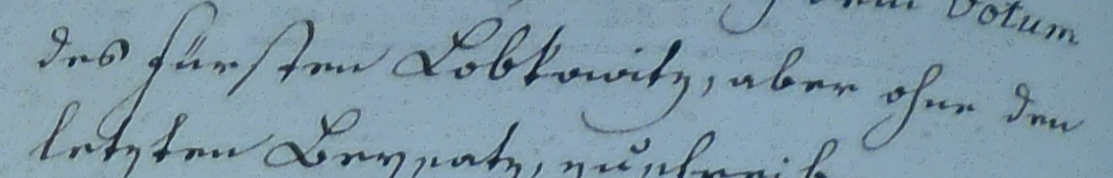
des Fürsten Lobkowitz, aber ohne den
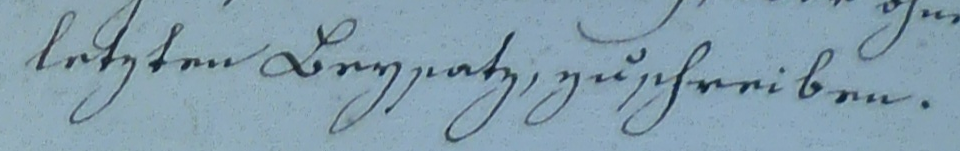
letzten Beysatz, zuschreiben.
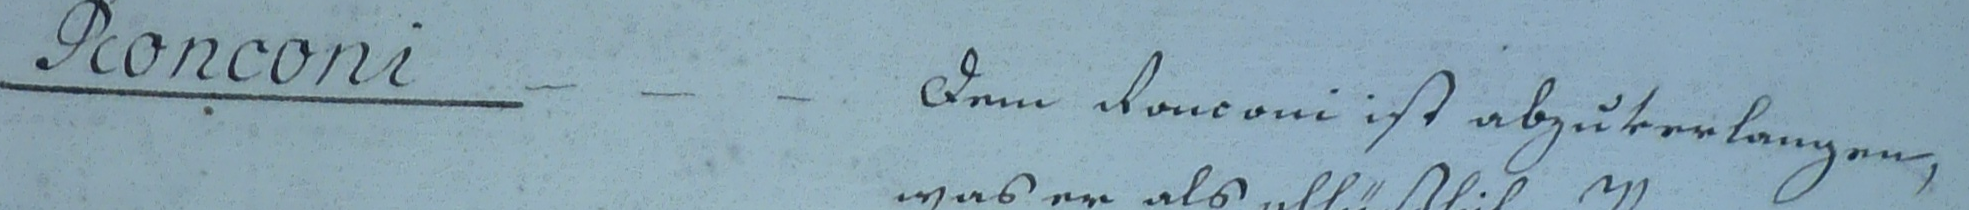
Ronconi _ _ _ Dem Ronconi ist abzuverlangen,
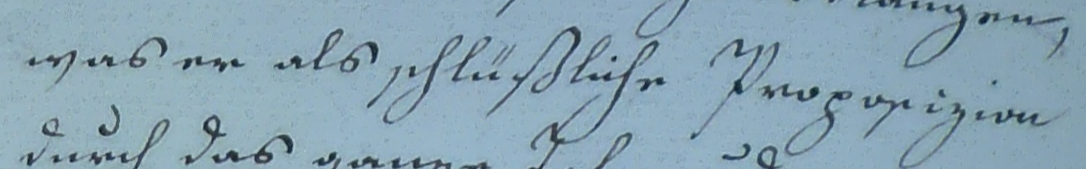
was er als schlüßliche Proposizion
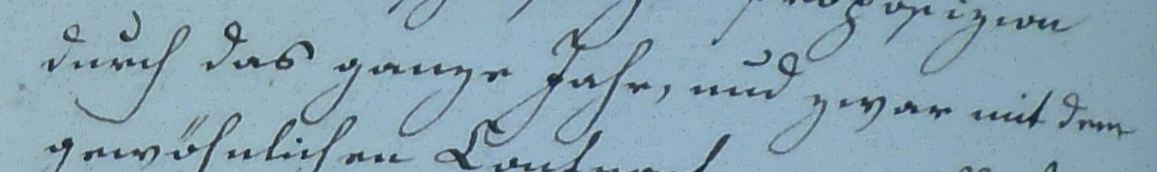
durch das ganze Jahr, und zwar mit dem
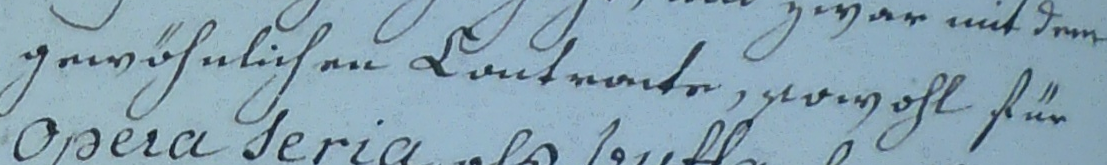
gewöhnlichen Contracte, sowohl für
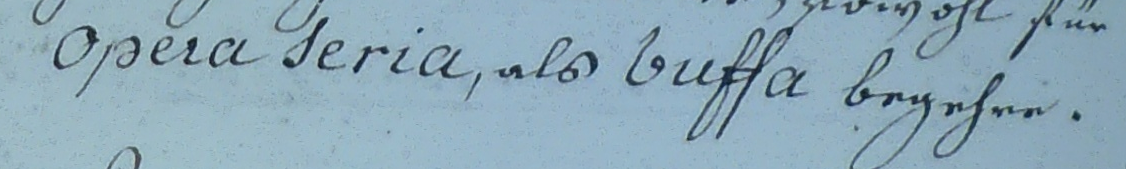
Opera Seria, als Buffa begehre.
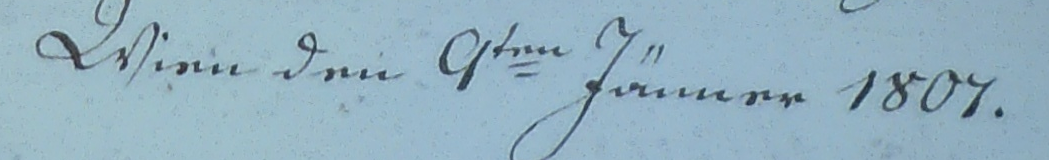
Wien den 9te͇n Jänner 1807.
